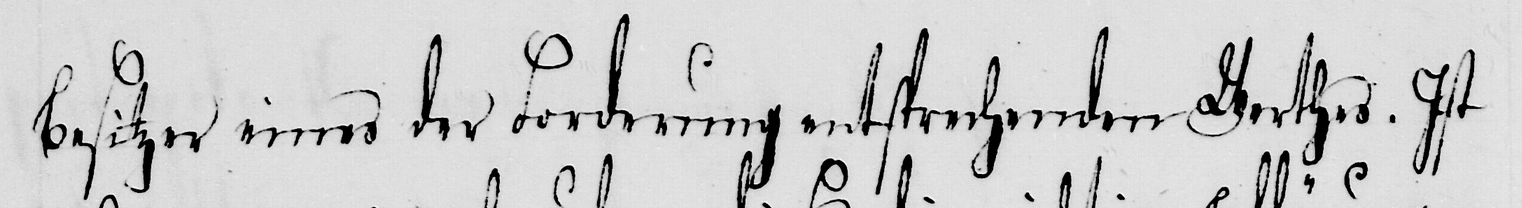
Besitzer eines der Forderung entsprechenden Werthes. Ist
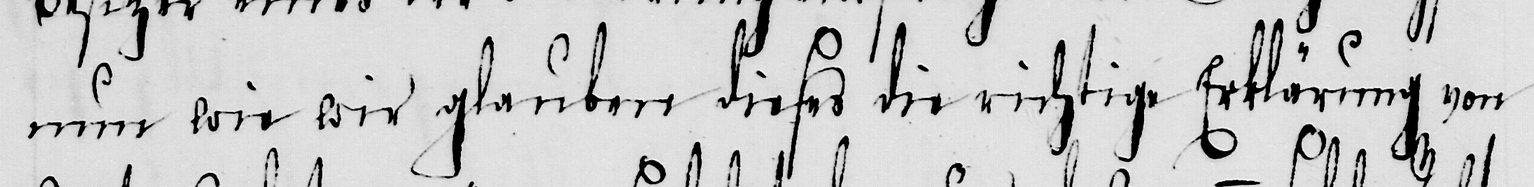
nun wie wir glauben dieses die richtige Erklärung von
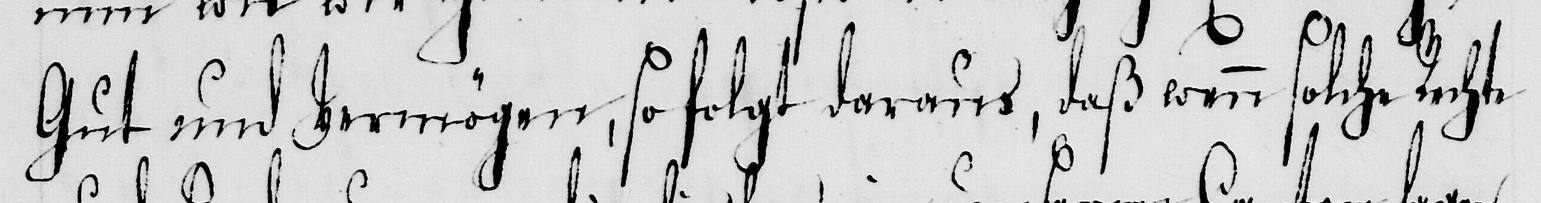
Gut und Vermögen, so folgt daraus, daß wenn solche Rech¬
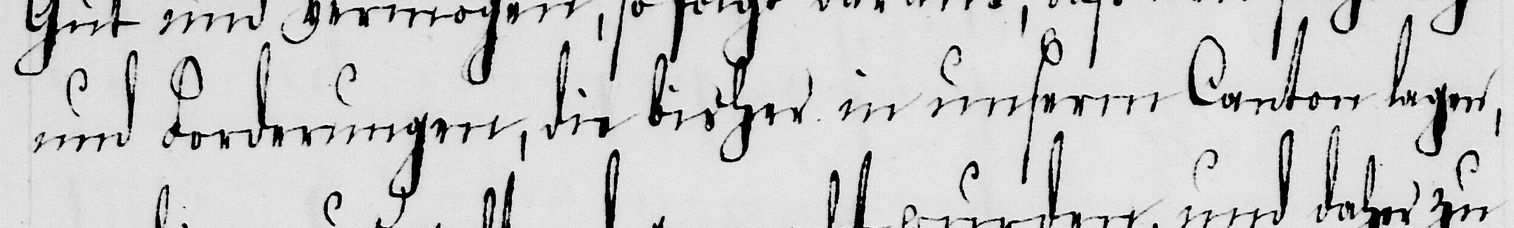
und Forderungen, die bisher in unserm Canton lagen,
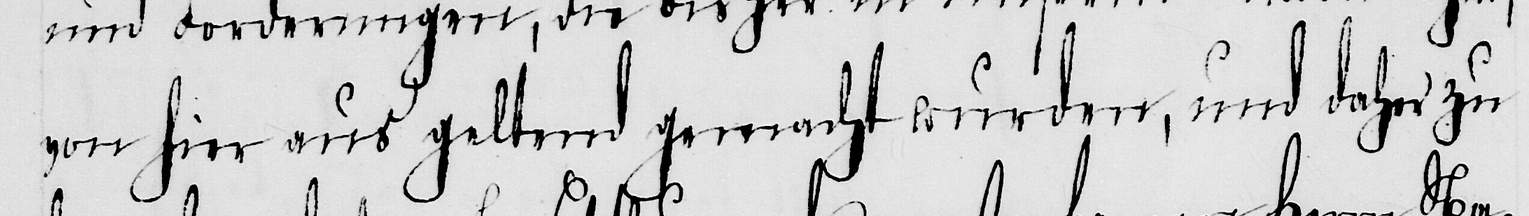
von hier aus geltend gemacht wurden, und daher zu
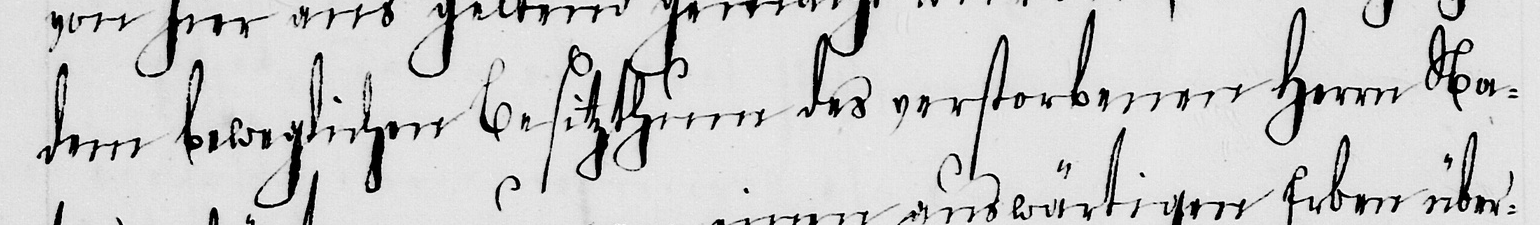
dem beweglichen Besitzthum des verstorbenen Herrn Na¬
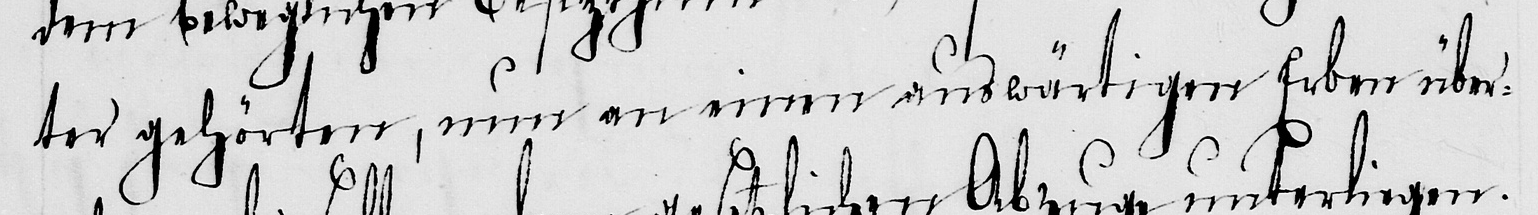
ter gehörten, nun an einen auswärtigen Erben über¬
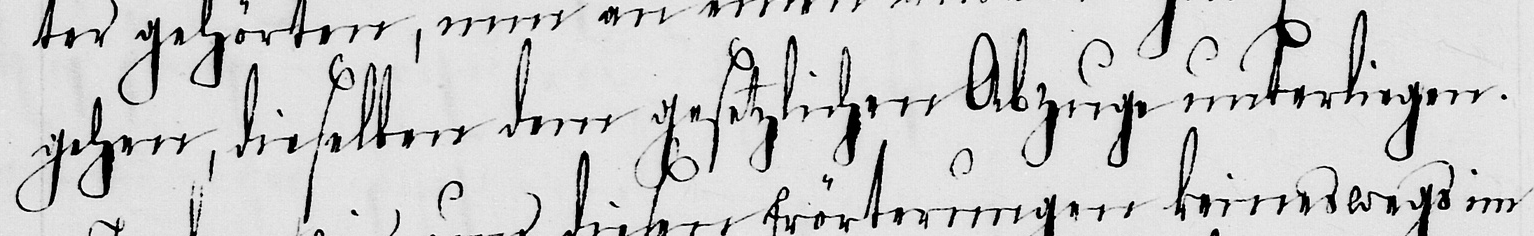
gehen, dieselben dem gesetzlichen Abzuge unterliegen.
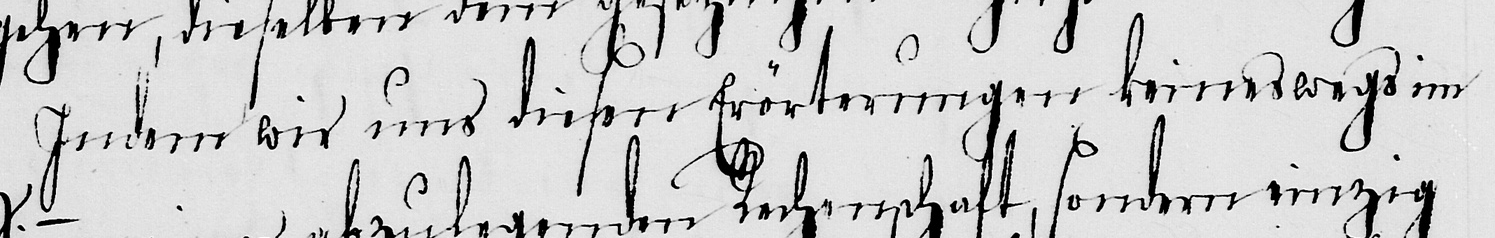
Indem wir uns diesen Erörterungen keineswegs im
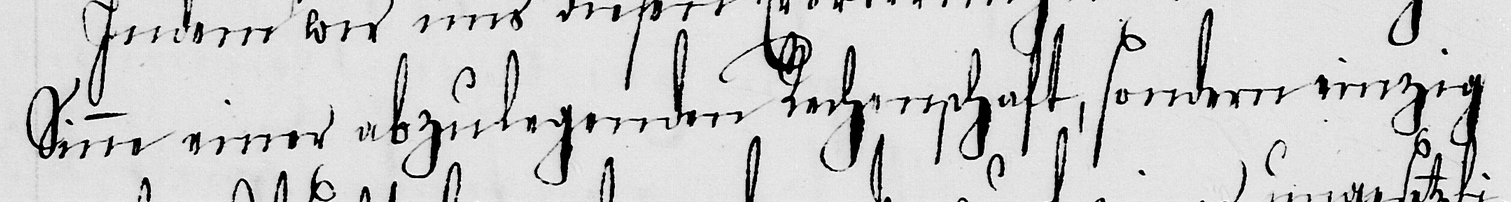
Sinne einer abzulegenden Rechenschaft, sondern einzig
